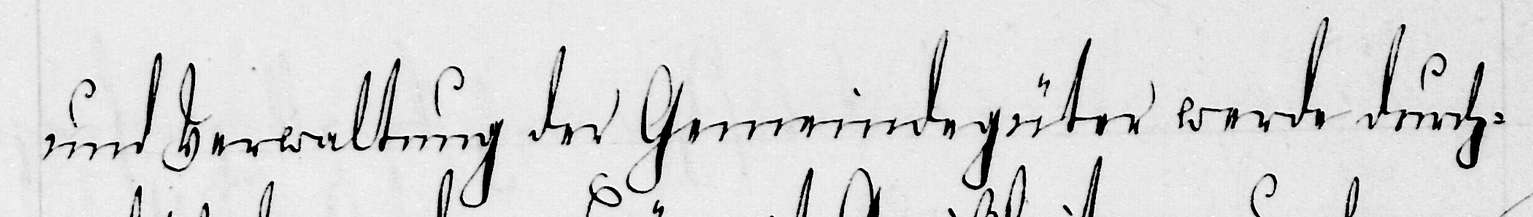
und Verwaltung der Gemeindegüter werde durch¬
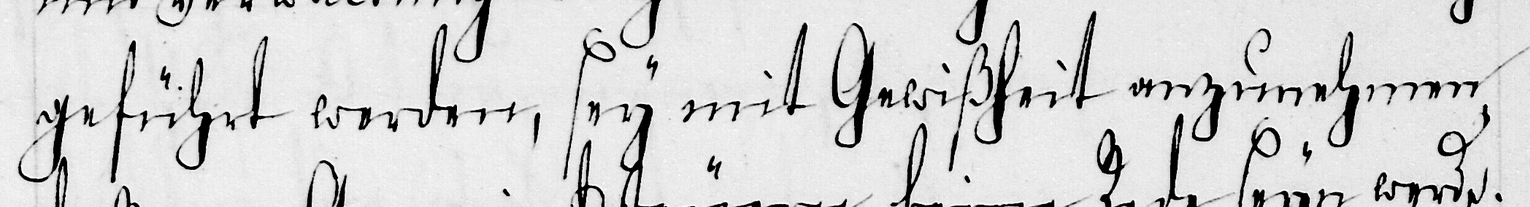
geführt werden, sey mit Gewißheit anzunehmen,
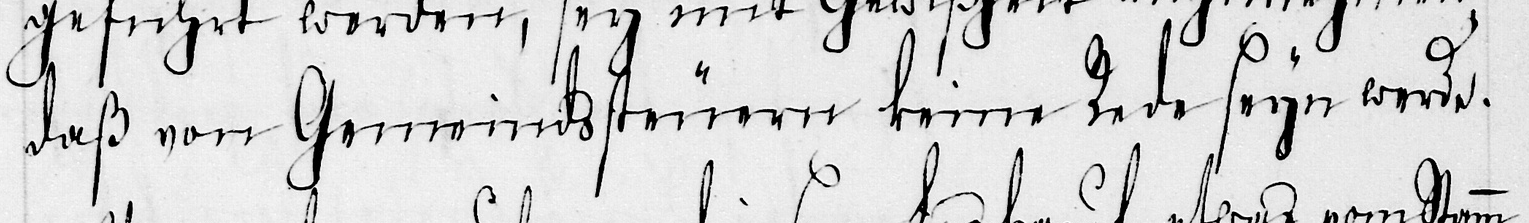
daß von Gemeindssteuern keine Rede seyn werde.
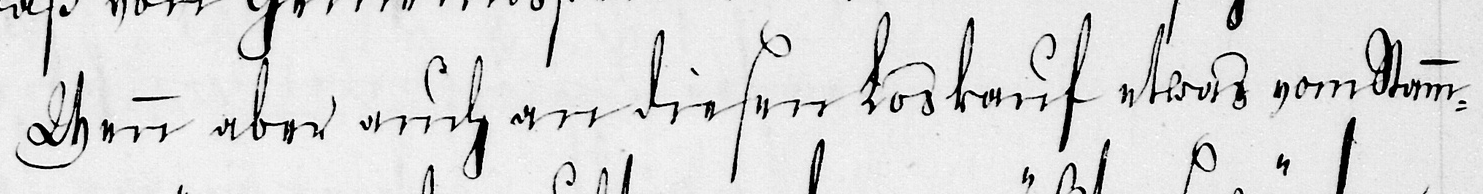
Wenn aber auch an diesen Loskauf etwas von Stamm¬
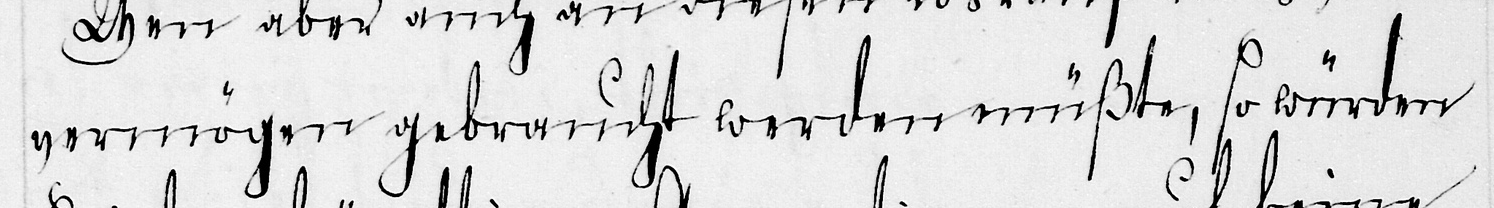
vermögen gebraucht werden müßte, so würden
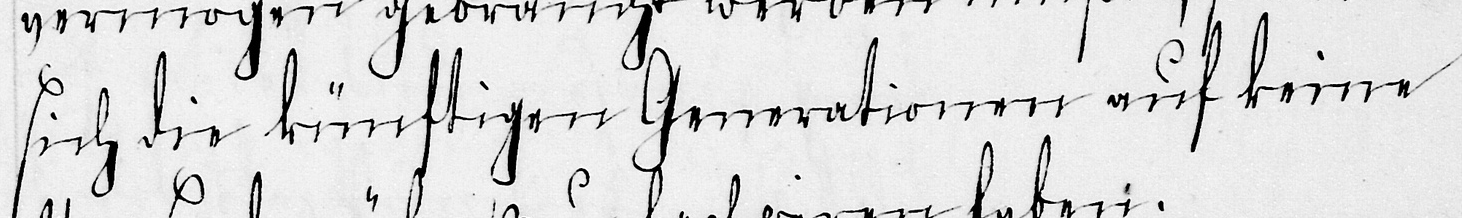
sich die künftigen Generationen auf keine
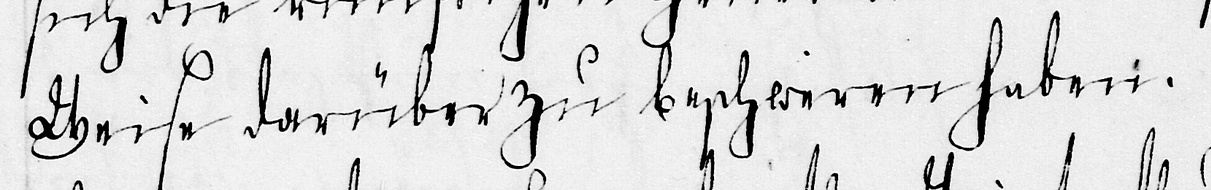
Weise darüber zu beschweren haben.
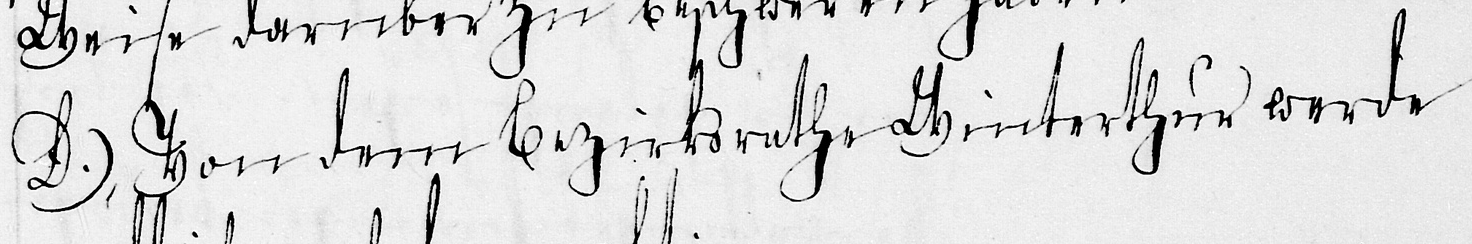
D.) Von dem Bezirksrathe Winterthur werde
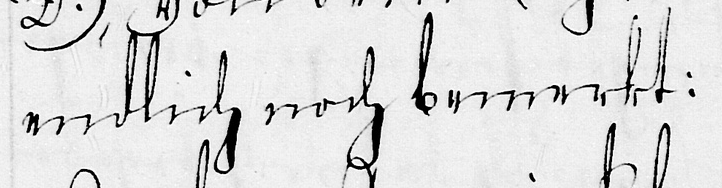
endlich noch bemerkt:
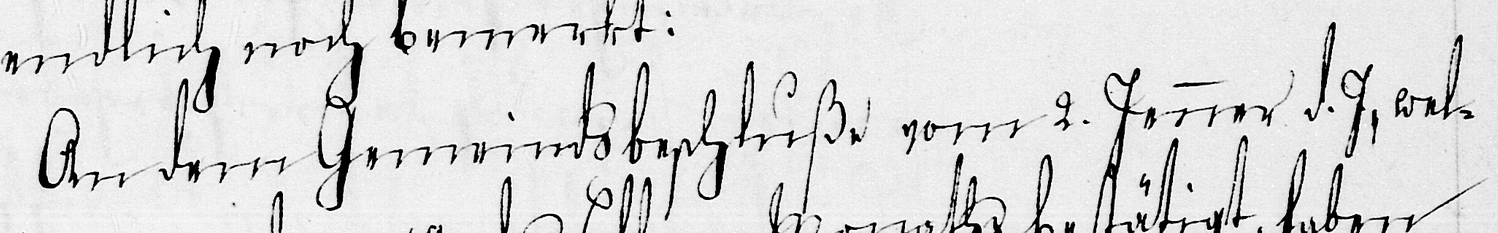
An dem Gemeindsbeschluße vom 2. Jenner d. J, wel¬
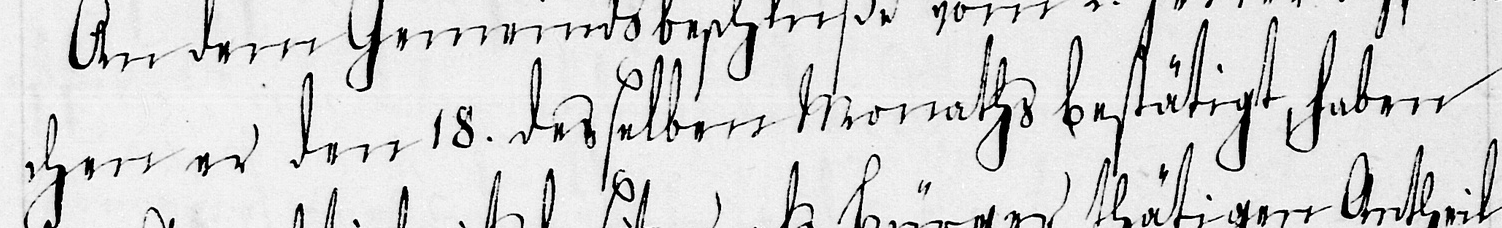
chen er den 18. desselben Monaths bestätigt, haben
